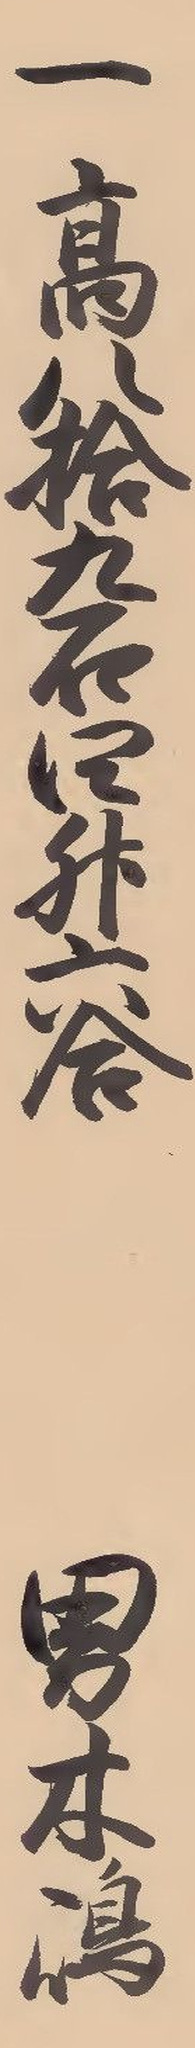一高八拾九石四升六合男木島
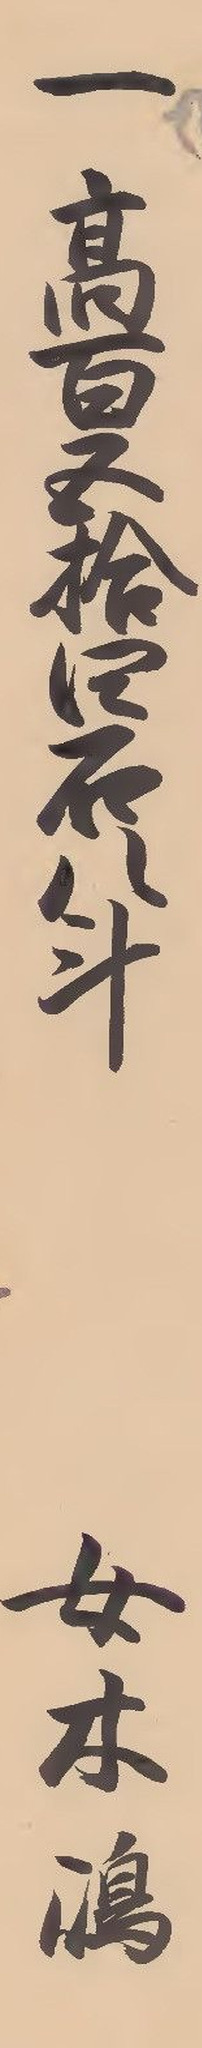一高百五拾四石八斗女木島

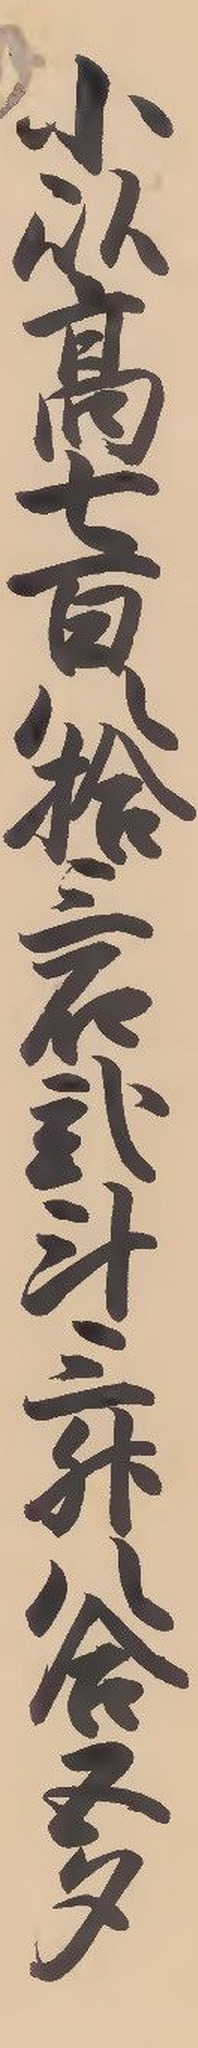小以高七百八拾三石弐斗三升八合五勺
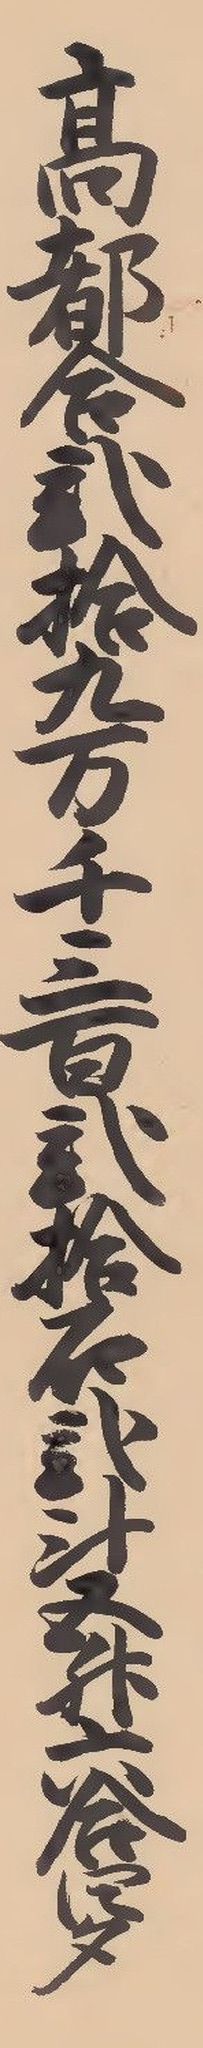高都合弐拾九万千三百弐拾石弐斗五升六合四勺
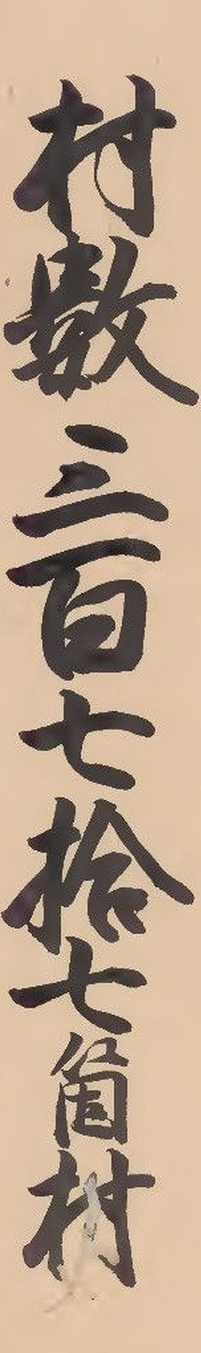村数三百七拾七箇村
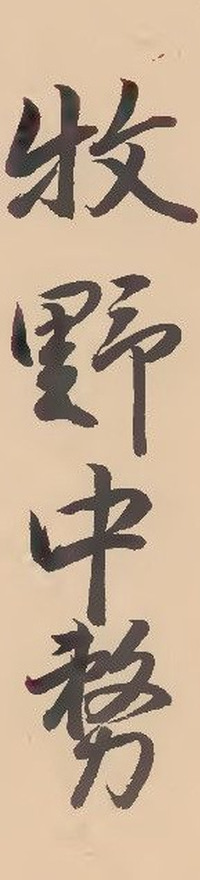牧野中務
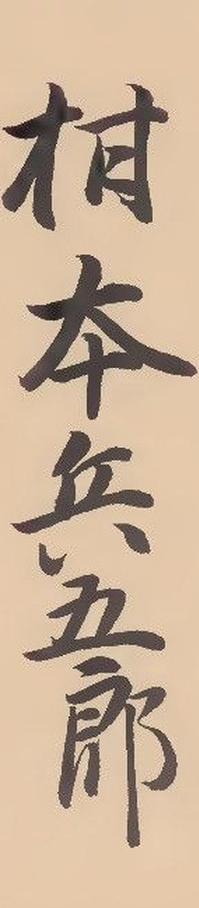柑本兵五郎
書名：讃岐国郷帳
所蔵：国立公文書館 National Archives of Japan
